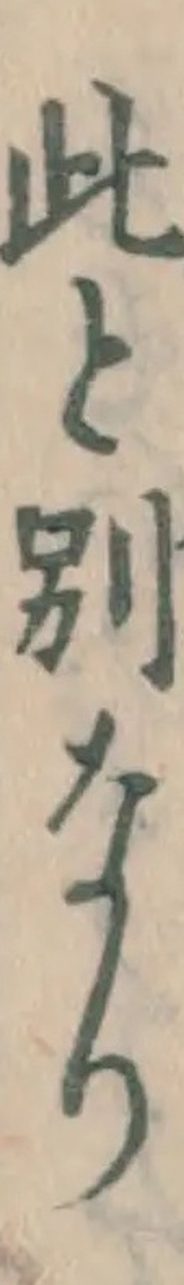此と別なり
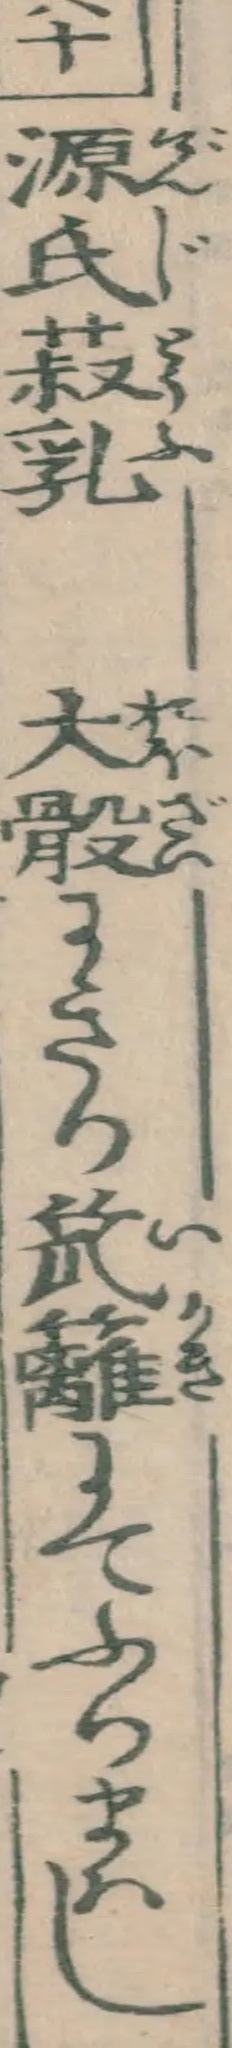六十源氏菽乳大骰にきり笊籬にてふりまわし
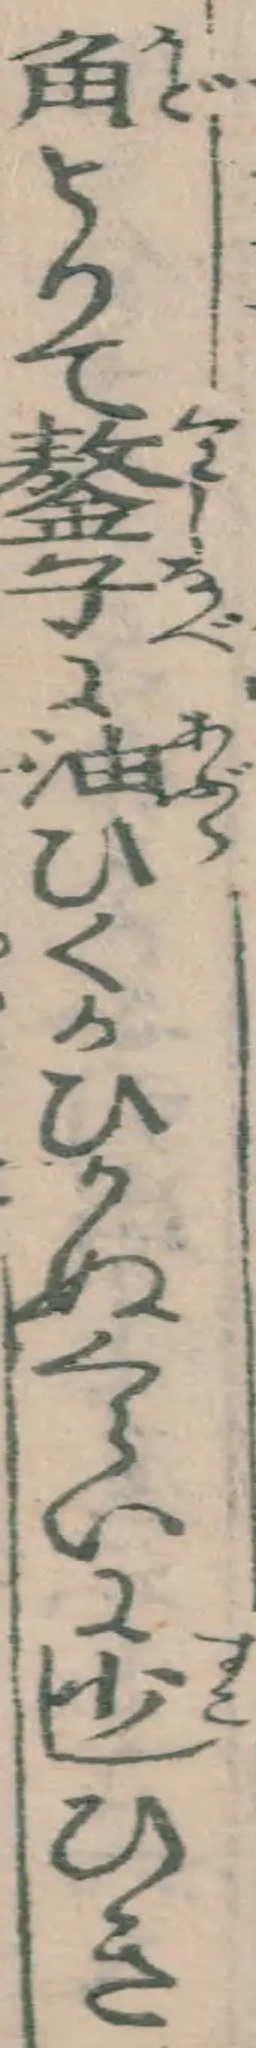角とりて鏊子に油ひくかひかぬくらいに少しひき
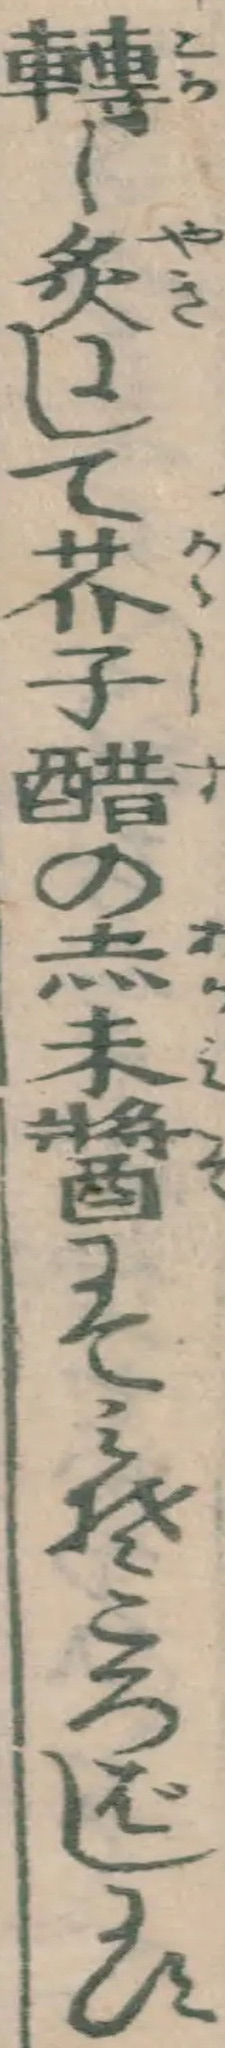転し炙にして芥子醋の赤未醤にてみそころばしにす
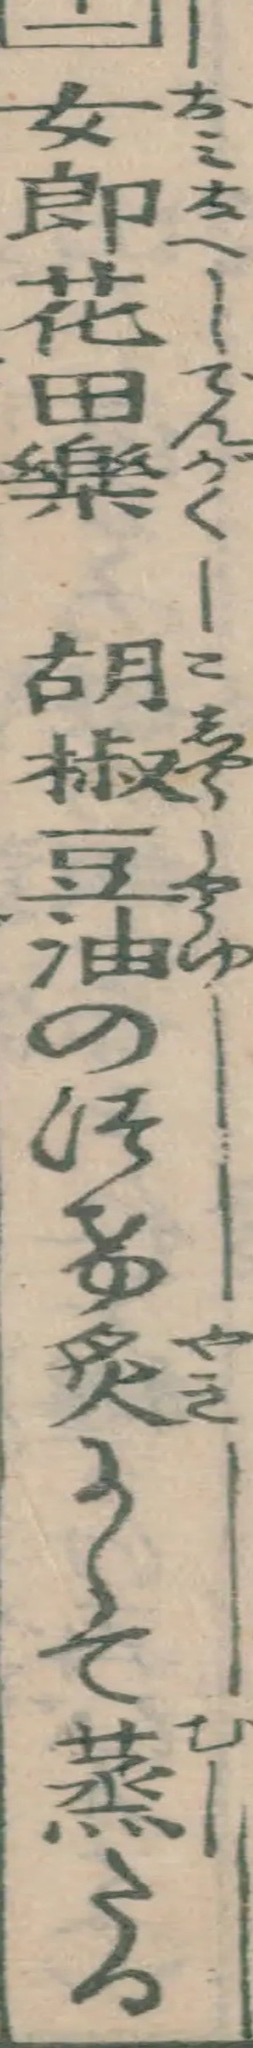六十一女郎花田楽胡椒豆油のつけ炙にして蒸たる
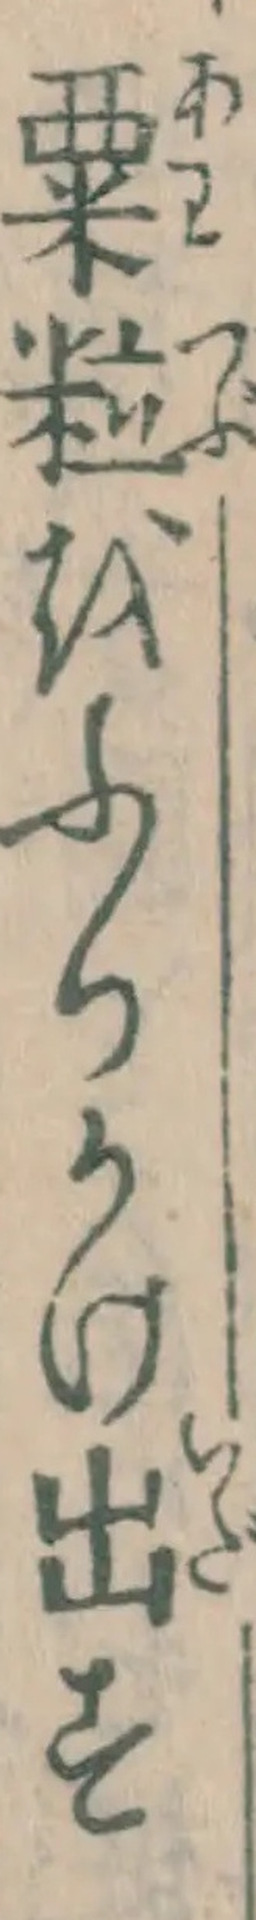粟顆をふりかけ出す
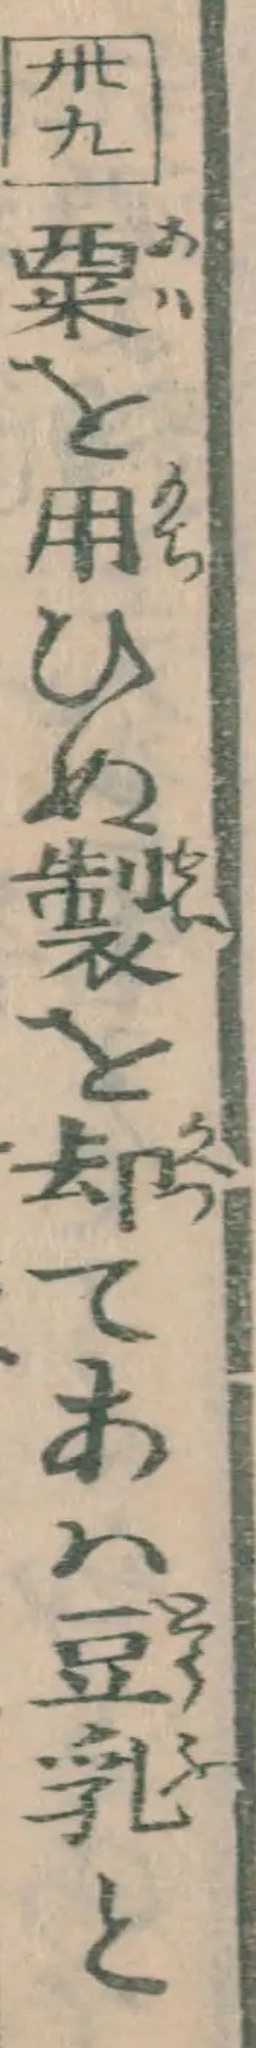卅九粟を用ひぬ製を却てあは豆乳と
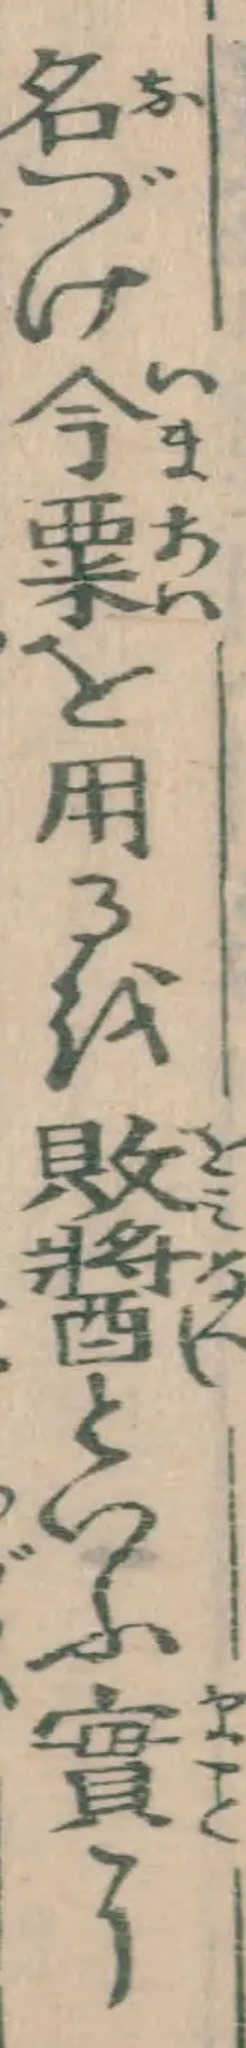名づけ今粟を用るを敗醤といふ実に
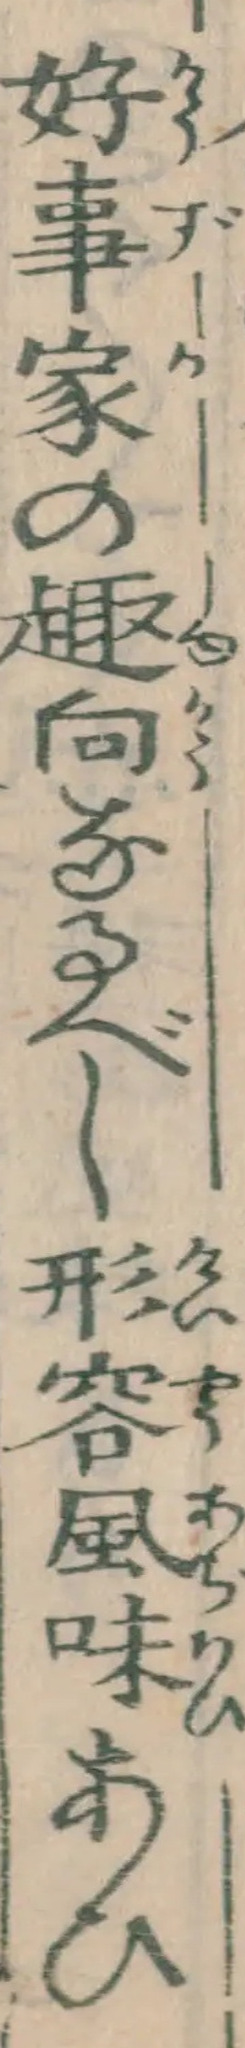好事家の趣向なるべし形容風味あひ
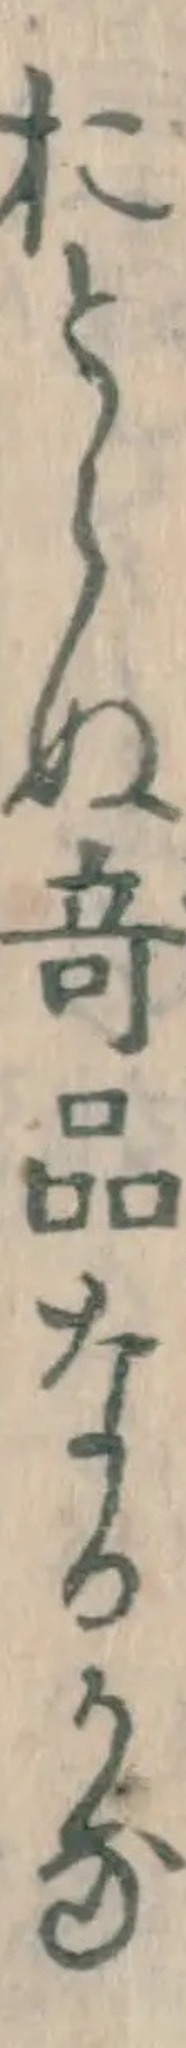おとらぬ奇品なるかな
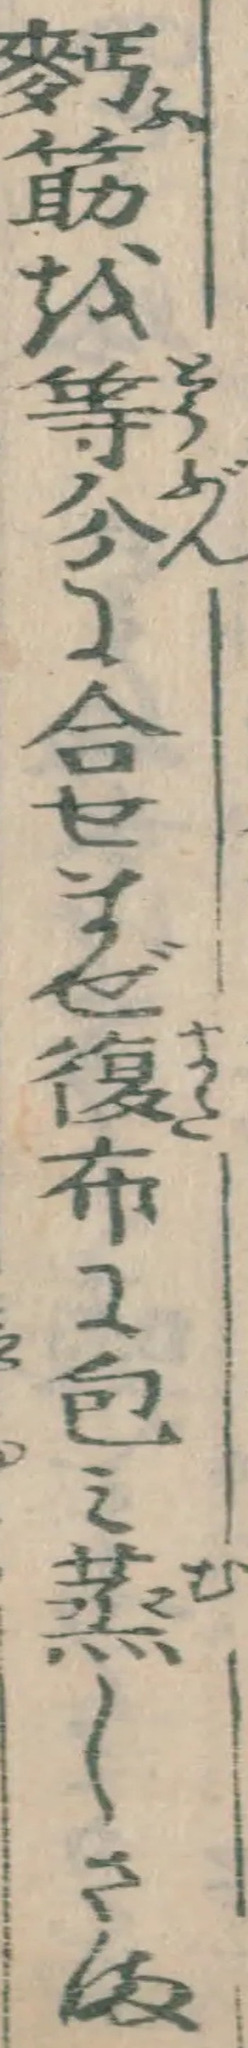麺筋を等分に合せまぜ復布に包み蒸しさま
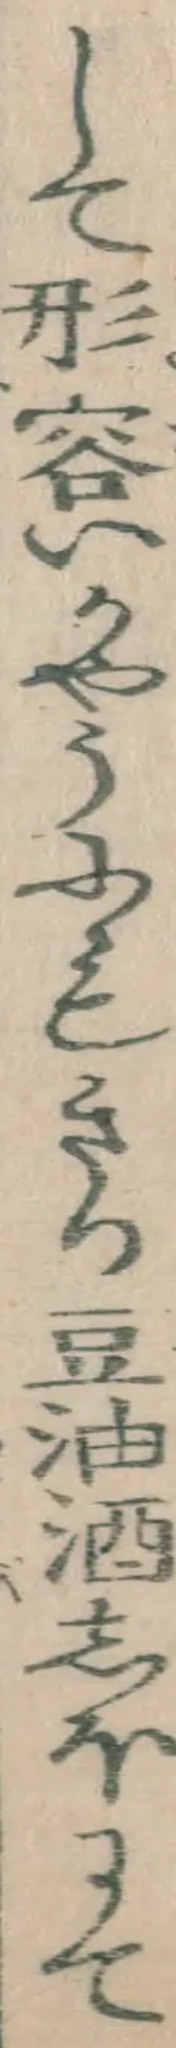して形容いかやうにもきり豆油酒しほにて
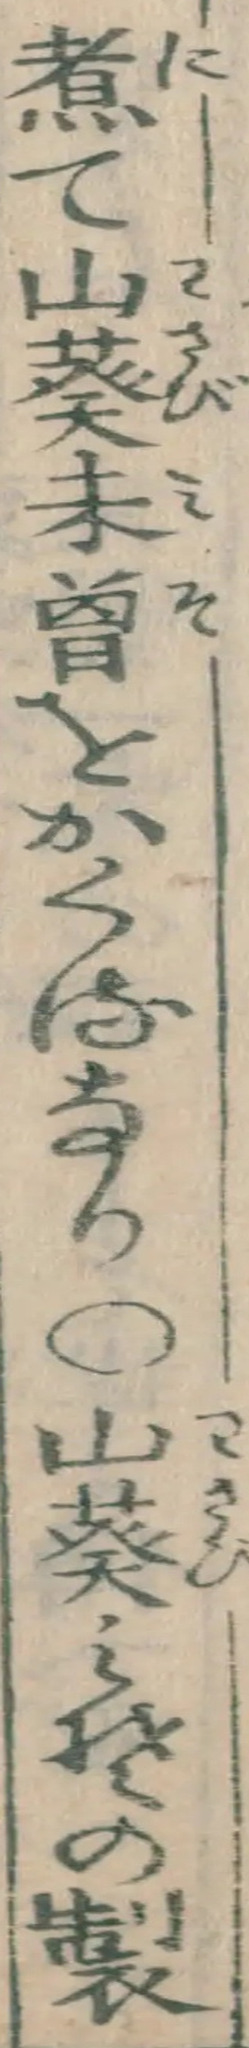煮て山葵未曽をかくるなり○山葵みその製
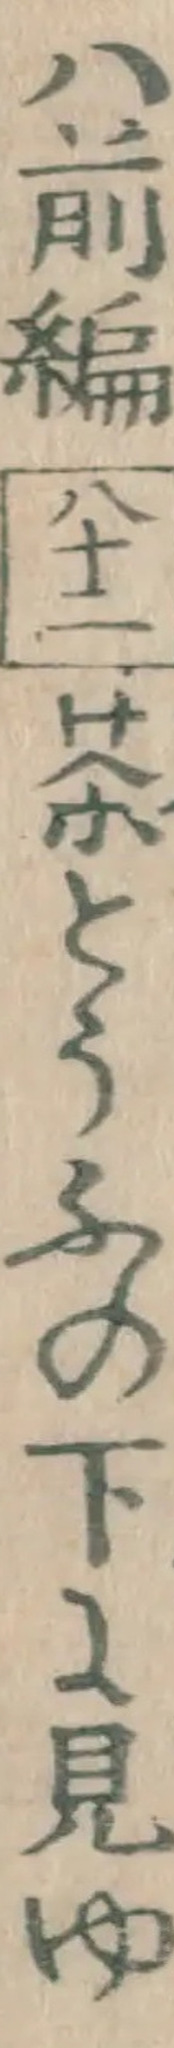は前編八十二茶とうふの下に見ゆ

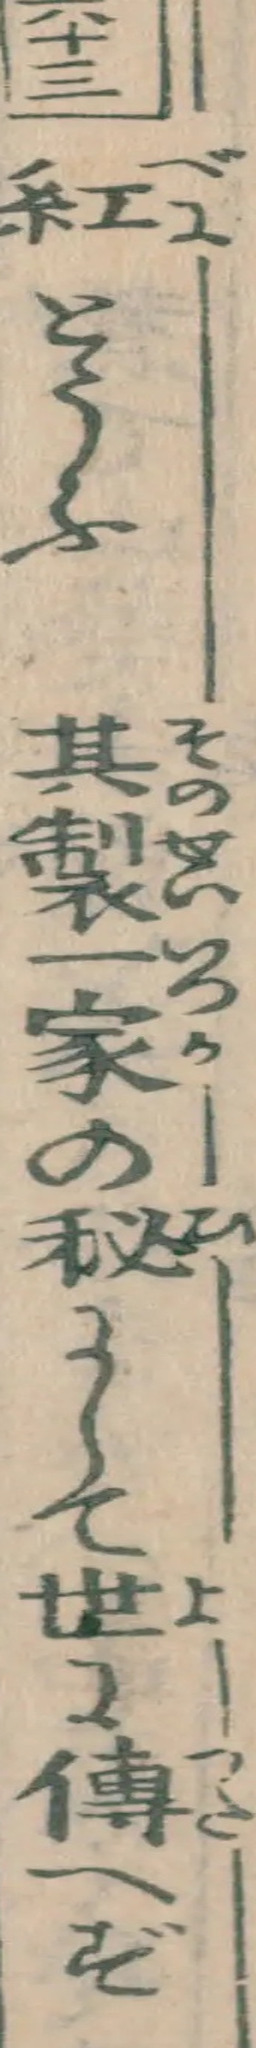六十三紅とうふ其製一家の秘にして世に伝へず
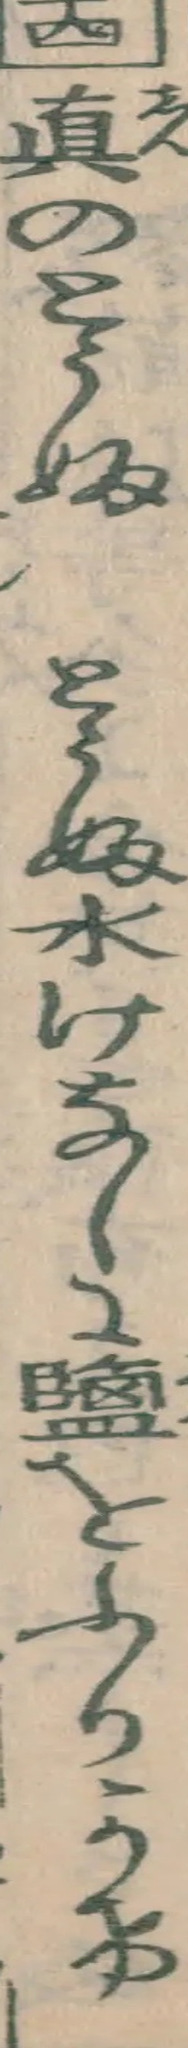六十四真のとうふとうふ水けなしに塩をふりかけ
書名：豆腐百珍. 続編
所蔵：国立国会図書館 National Diet Library, JAPAN
